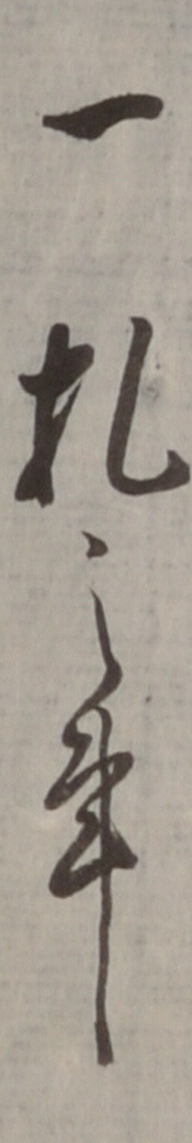一札之事
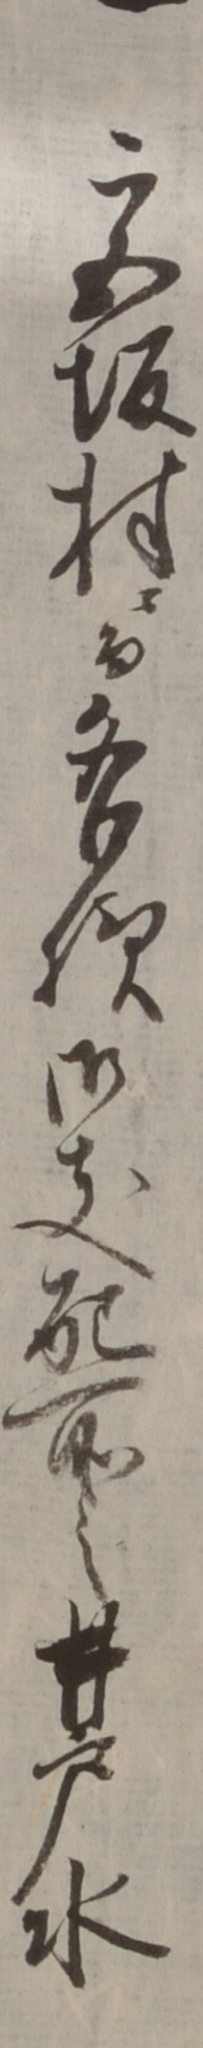一宮坂村ニ而各様御支配所之井戸水
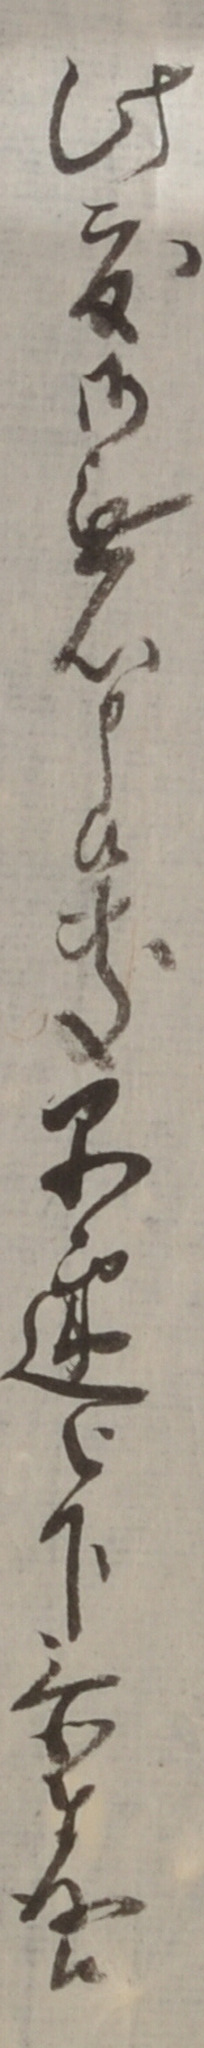此度御無心申候処早速被下忝奉存候
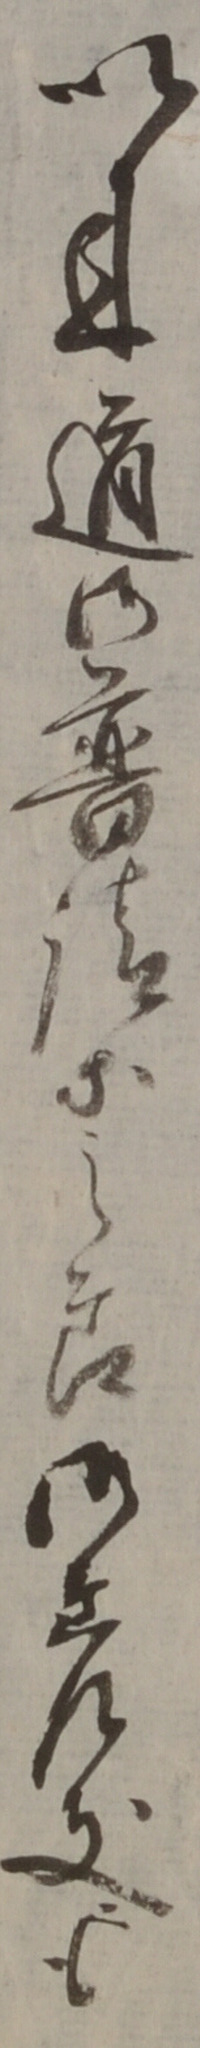以来道御普請等之節御差支ニも
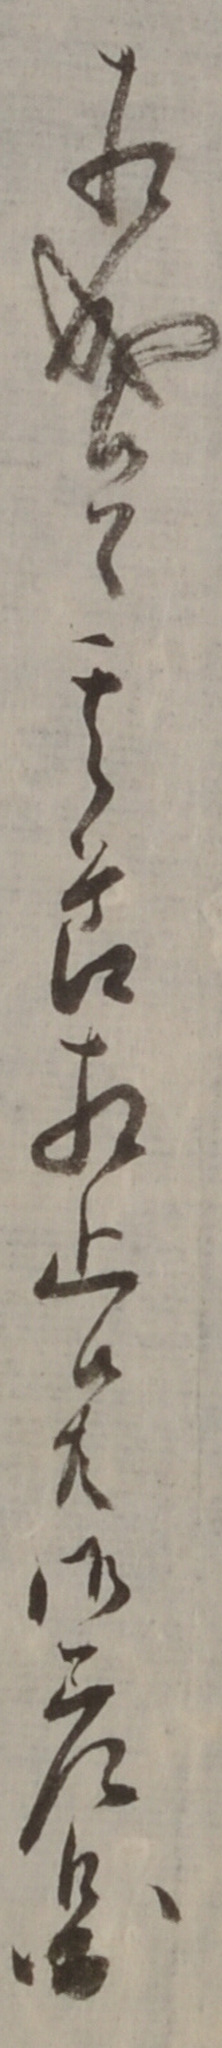相成候ハヽ其節相止候共御差図
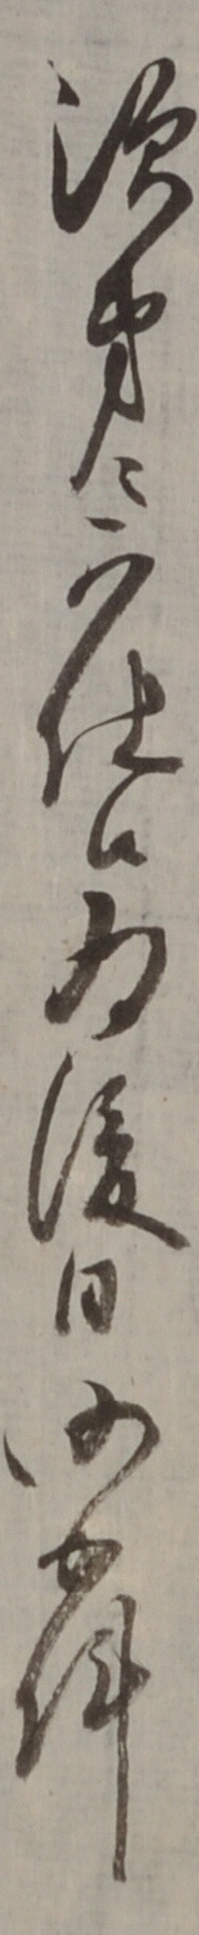次第ニ可仕候為後日仍如件
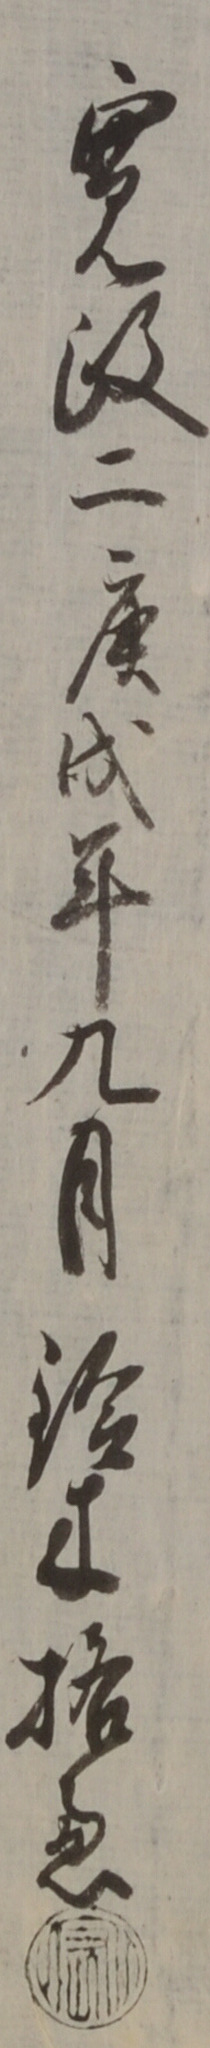寛政二庚戌年九月鈴木格恵㊞
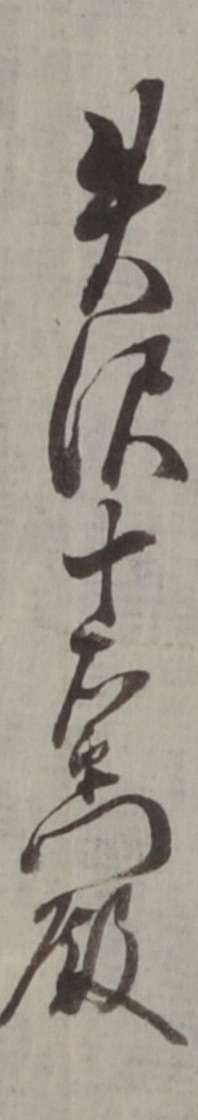矢沢十右衛門殿
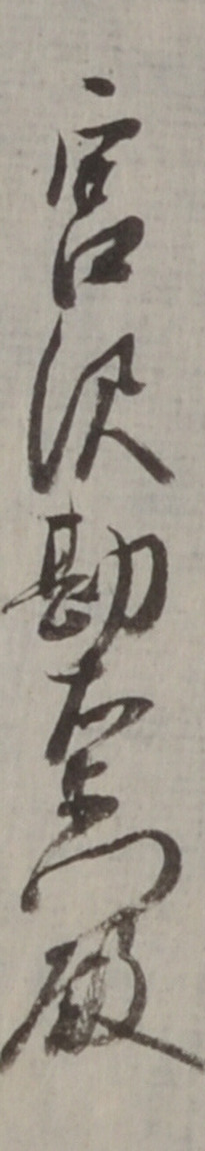宮沢貫右衛門殿
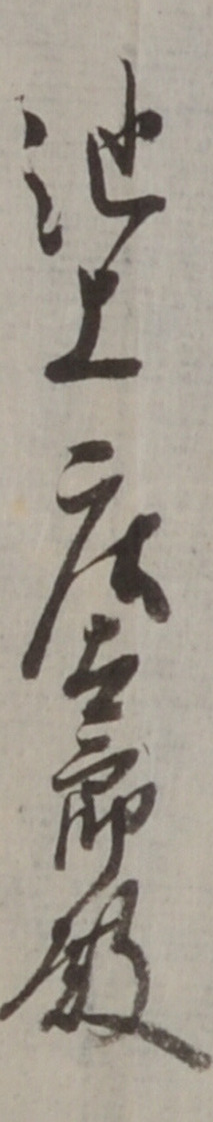池上庄太郎殿
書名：一札之事
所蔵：伊那市立高遠町図書館・合同会社AMANE
